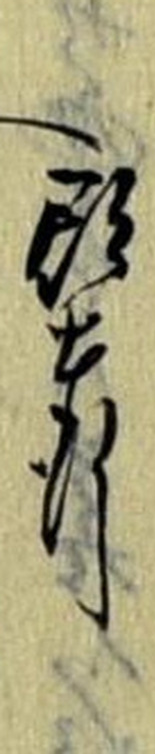郡奉行
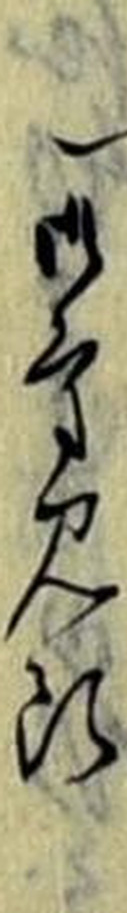御鳥見頭
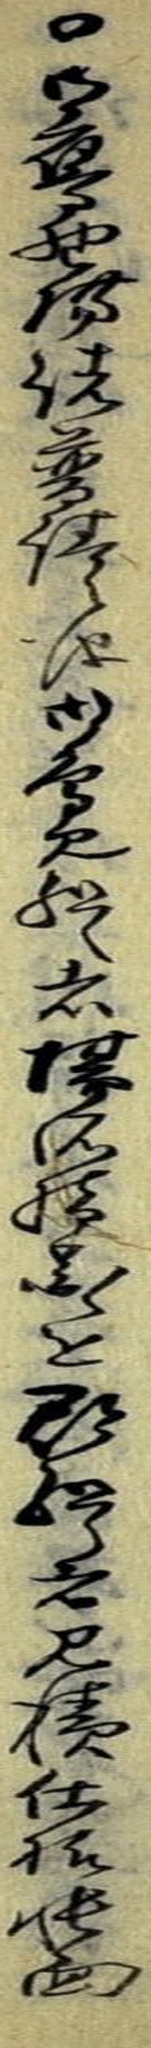〇御鷹野場諸普請之儀御鳥見組之者場所指図候を郡組之者見積仕様帳面
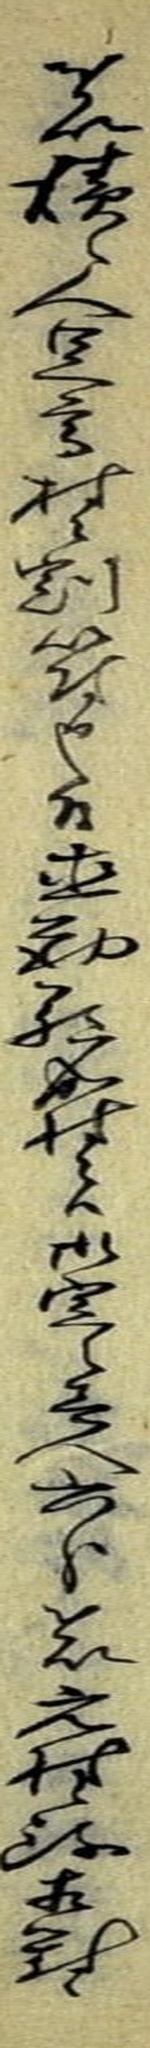を以積候人足高村々割符申付直勤難成村々ハ御定之壱人六歩を以元村へ致相対候
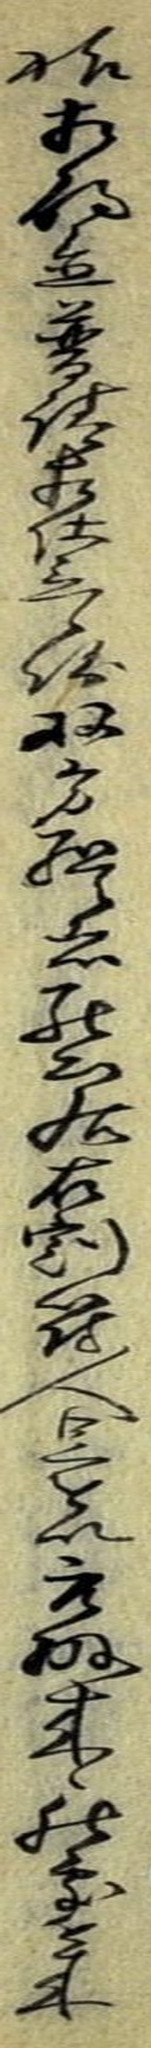様相触置普請相仕立候儀双方組之者罷出居右割符人足を以取扱来候然処近来
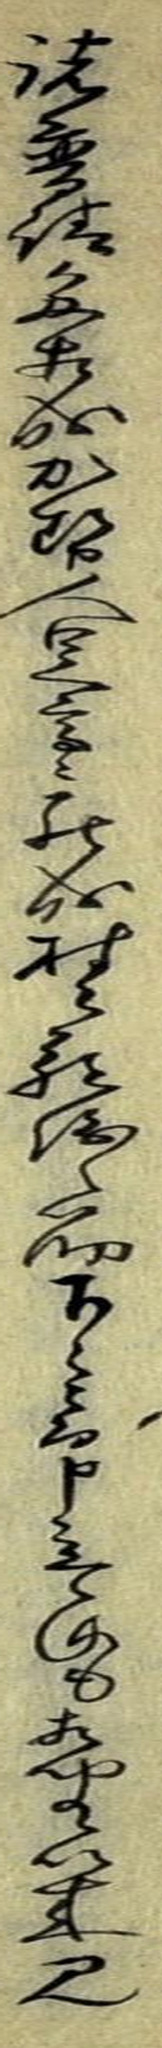諸普請多相成加勢人足高ニ罷成村々難儀之筋下々ニ而申立候趣も相聞候以来見
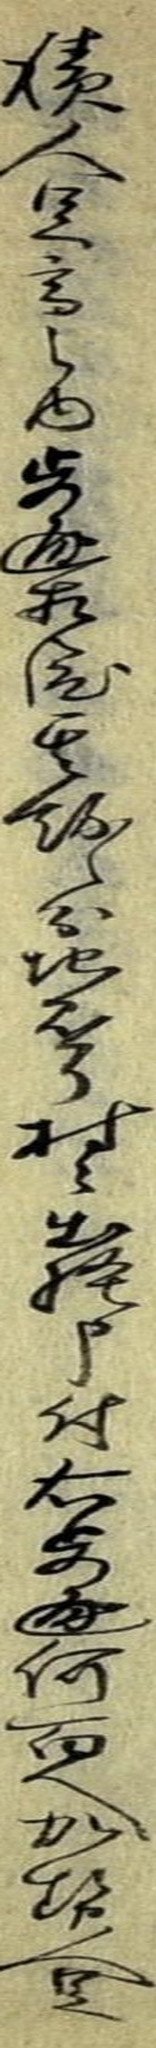積人足高之内歩通相渡其余之分地懸り村々出捨申付右歩通何百人加勢人足
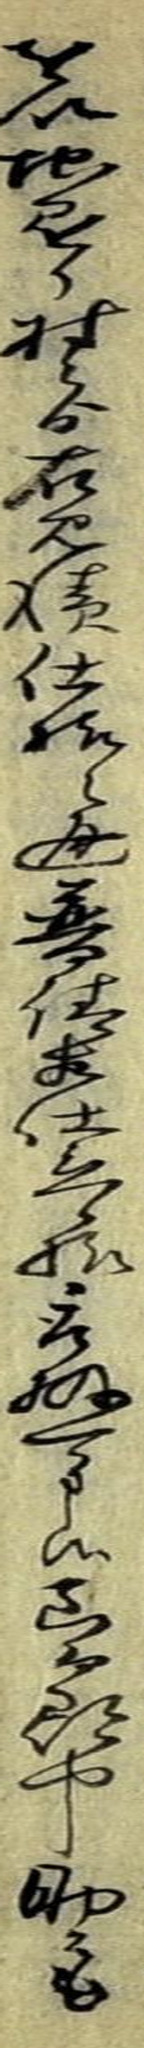を以地懸り村々ゟ右見積仕様之通普請相仕立候様取扱可申候至而郡中助ニも
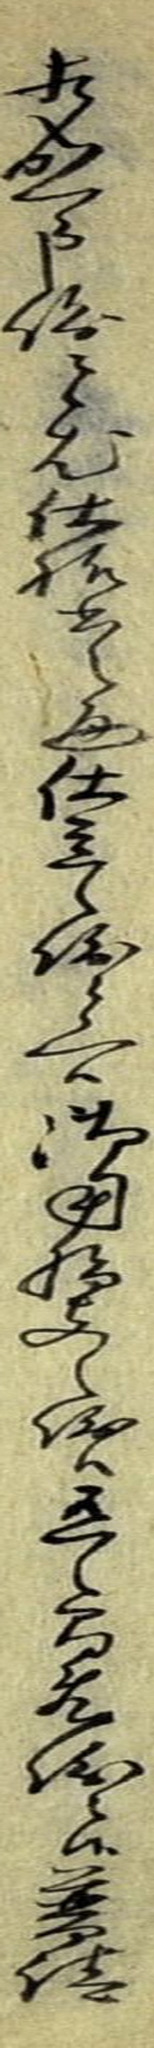相成可申儀ニ候尤仕様書之通仕立候儀ニ候ヘハ御用指支之儀ハ有之間敷儀ニ候普請
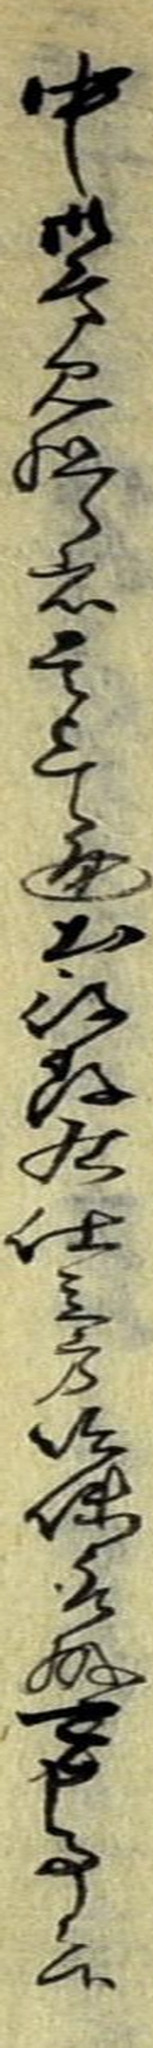中御鳥見組之者是迄之通出役致居仕立方吟味取扱可申事ニ候

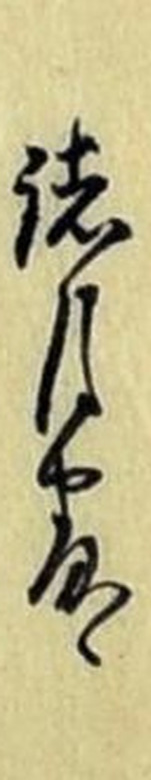諸月番へ
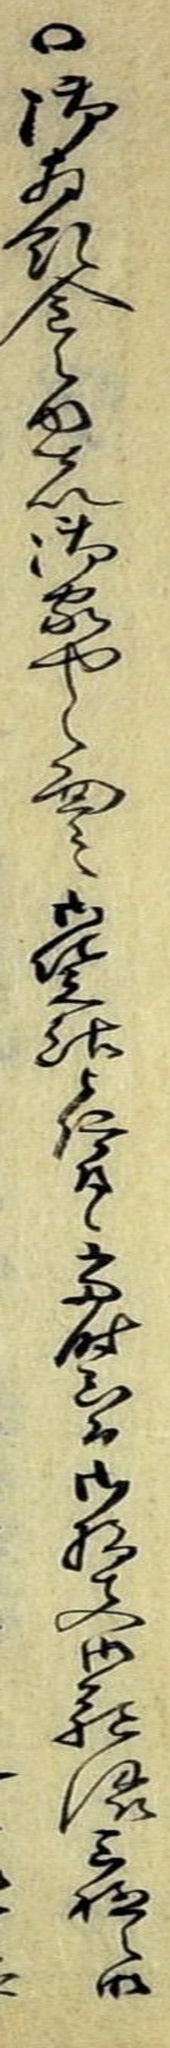〇御拝領金之内を以御家中之面々へ於貸銀被仰付候当時至而御指支御難渋至極之御
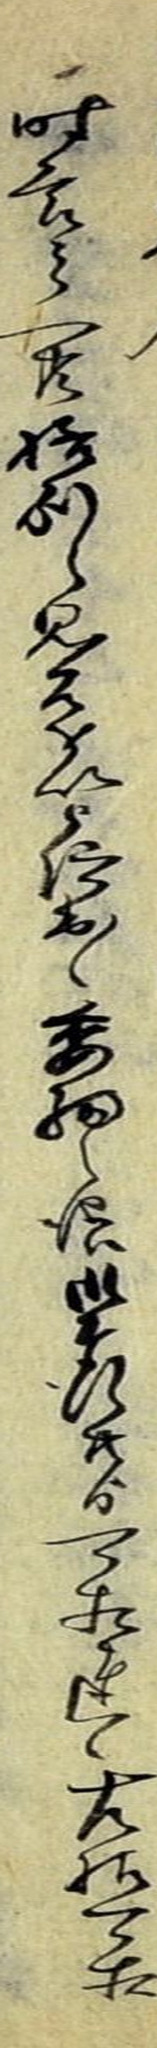時節ニ候へ共格別之思召を以被仰出候委細之儀ハ御奉行共ゟ可相達候左様可相
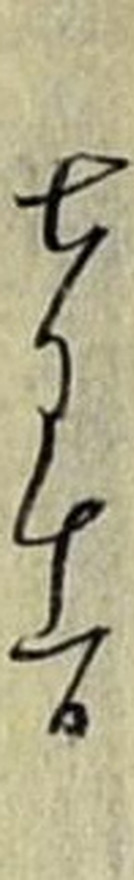七月十一日
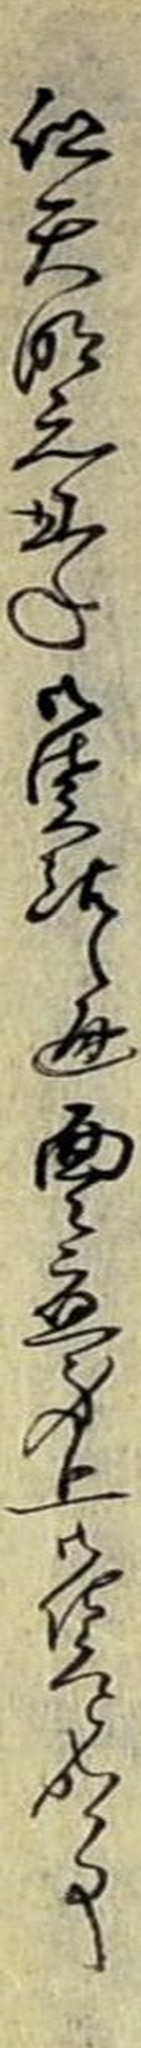但天明元丑年御貸銀之通面々応身上御貸被成候事
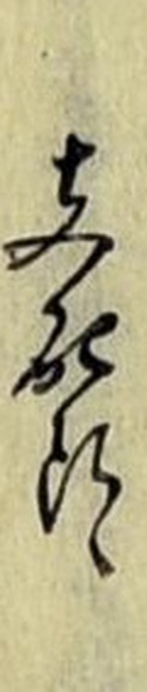支配頭へ
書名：命令之部 三
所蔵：福井県文書館 Fukui Prefectural Archives
